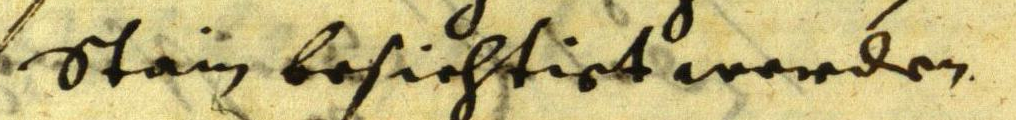Stain besichtigt werden.
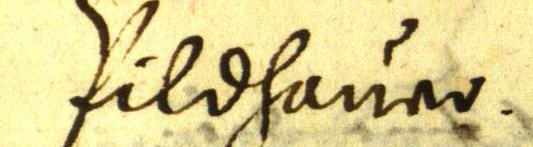Pildhaūer.
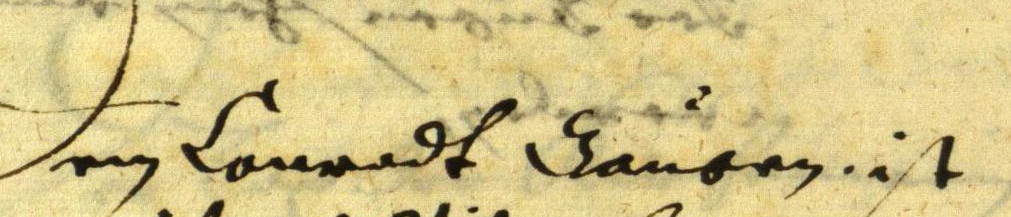Dem Conradt Gaūgen. ist
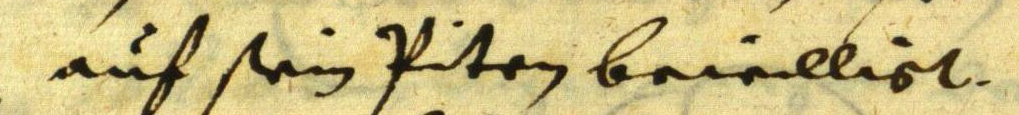aūf sein Piten bewilligt.
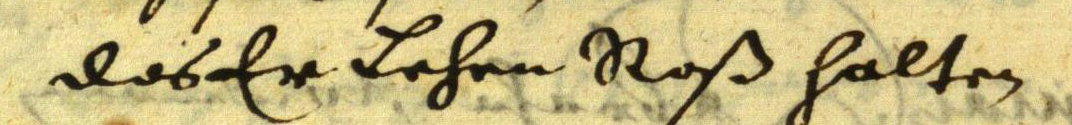das Er Lehen Roß halten
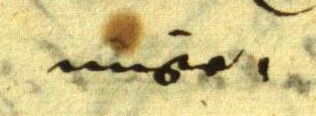mige.
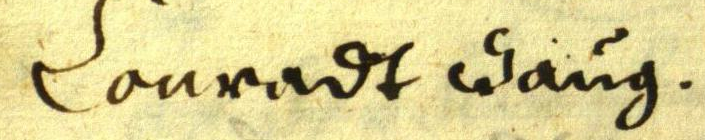Conradt Gaūg.
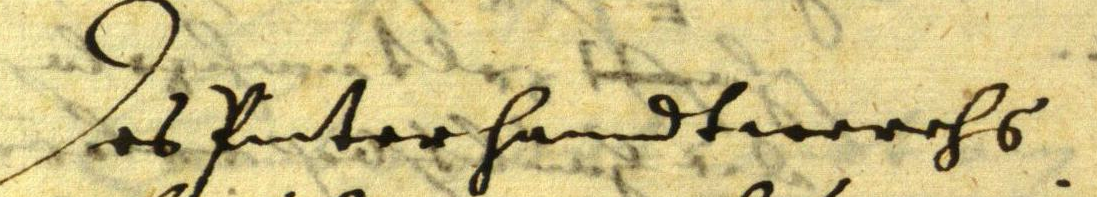Des Pinter handtwerchs
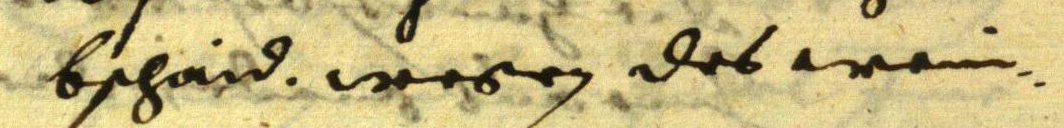bschaid. wegen des wein¬
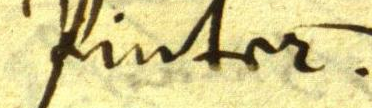Pinter.
